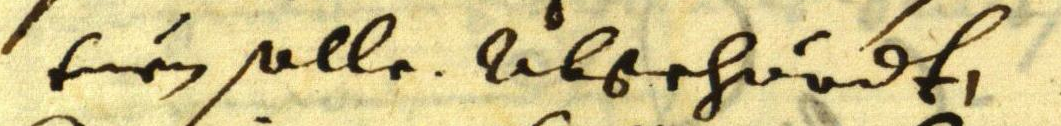tūen solle. Abgehōrdt,
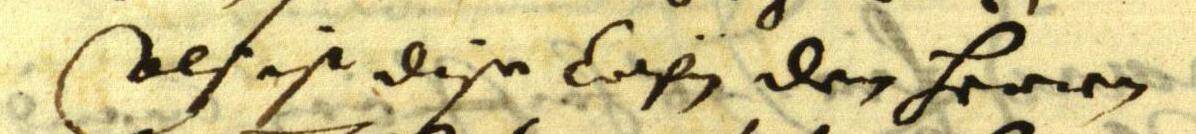Also ist dise CoPi den herrn
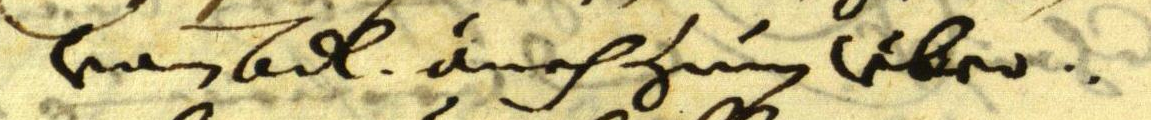vom Adl. aūch Zūm vber¬
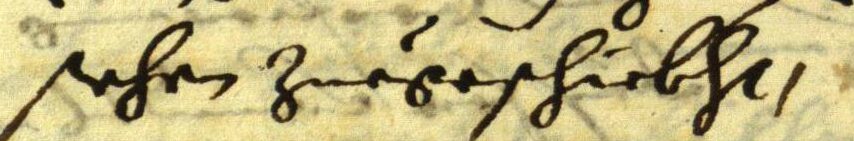sehen Zūegschickht,
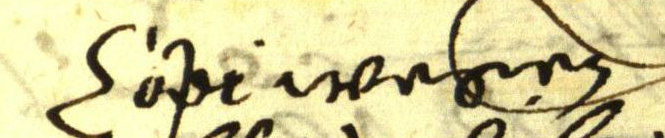CoPi wegen
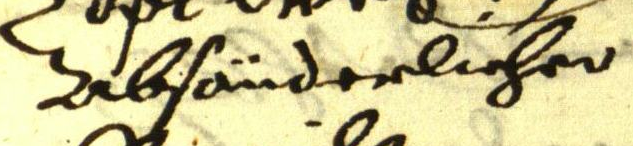Absönderlicher
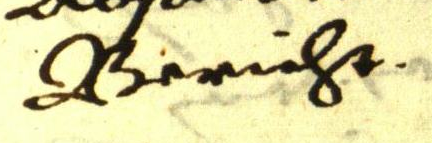Bericht.
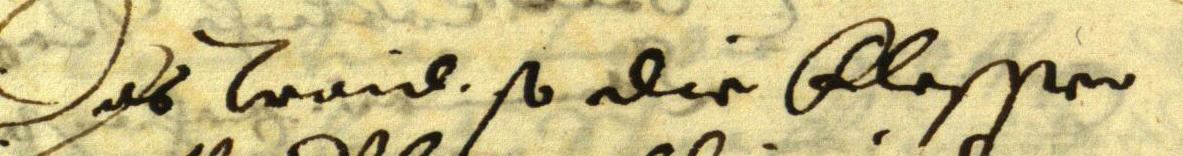Das Traid. so die Flesser
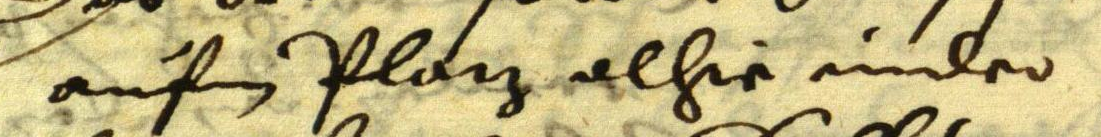aūfm Plaz alhie nider¬
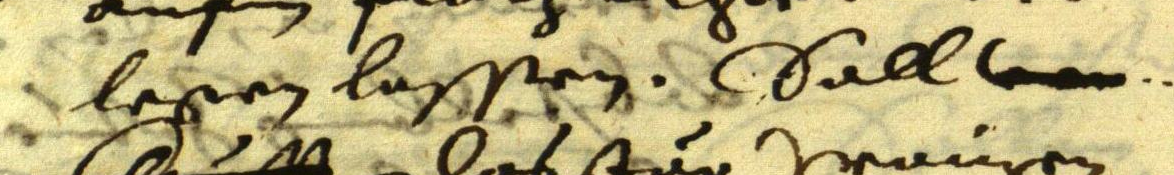legen lassen. Soll ver¬
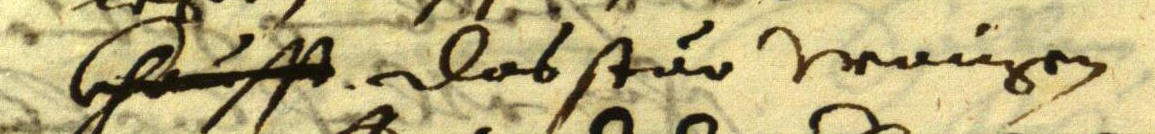khaūfft. das stār Waizen
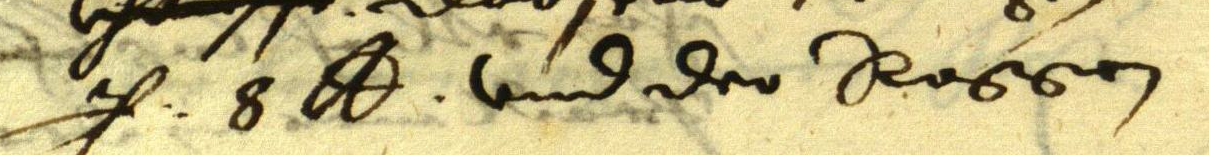P: 8 lb. vnd der Roggen
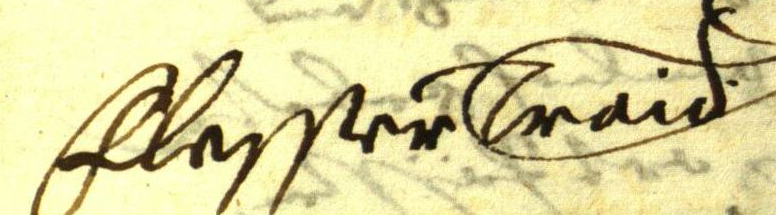Flesser Traid.
